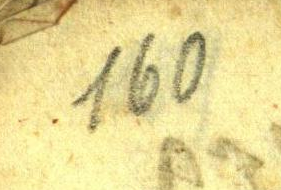160
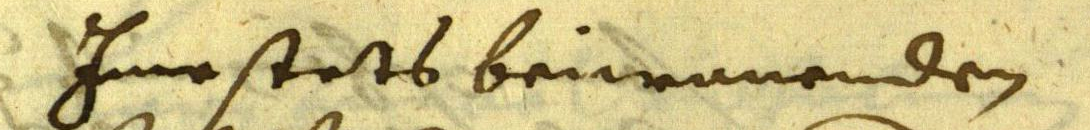Ime stets beiwonenden
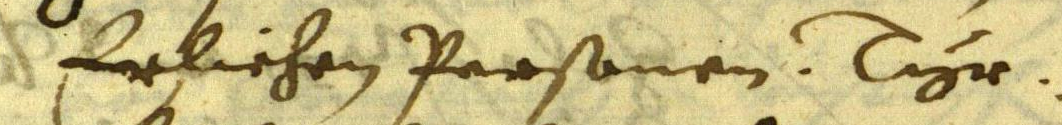Erlichen Personen. Tȳr¬
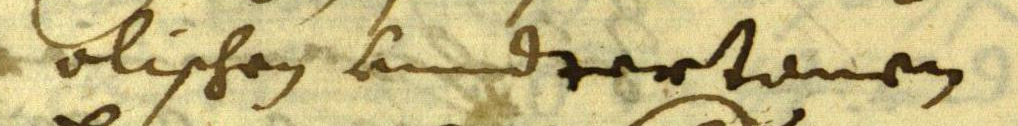olischen vnndtertanen
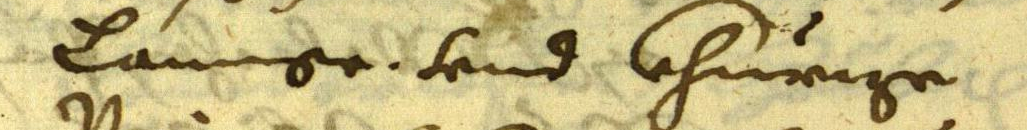Lannge. vnd khūrze
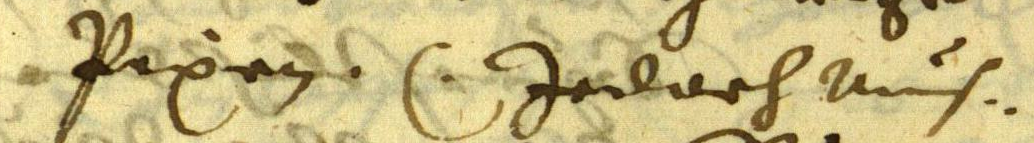Pixen .(.Jedoch Aūs¬
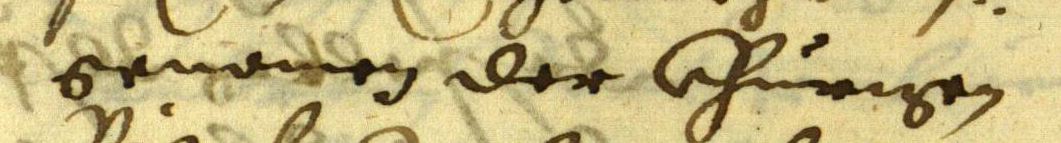genomen der khūrtzen
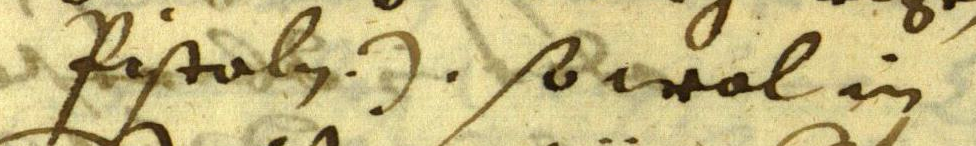Pistoln.). so wol in
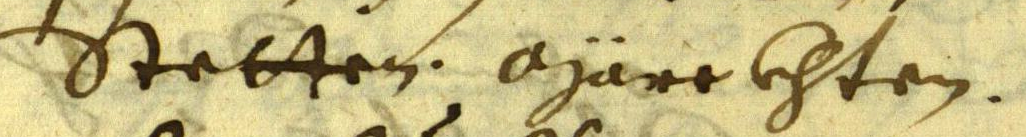Stetten. Märckhten.
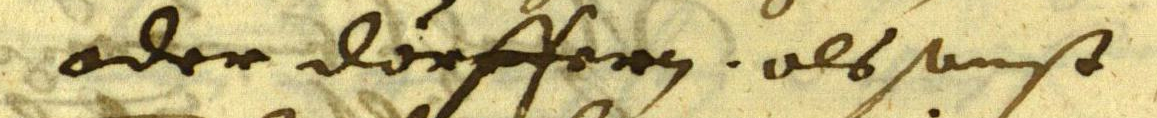oder dōrffern. als sonst
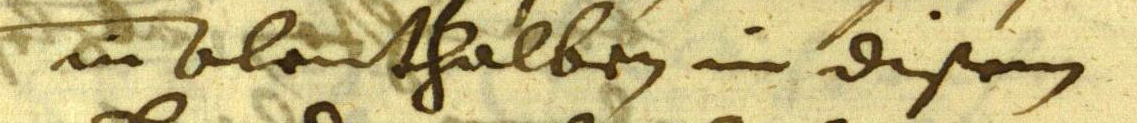in Alenthalben in disem
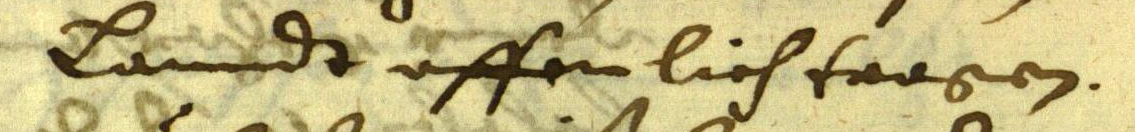Lanndt offenlich tragen.
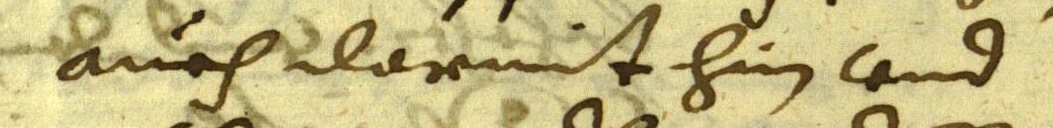aūch darmit hin vnd
